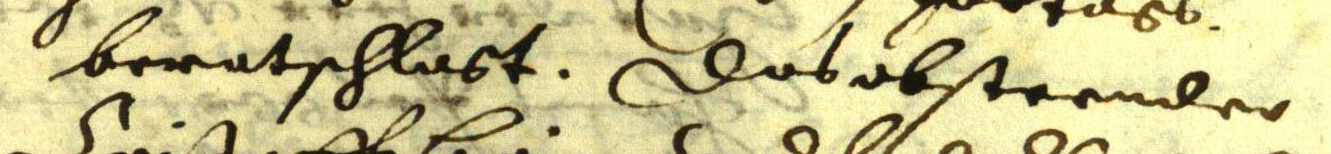beratschlagt. das obsteender
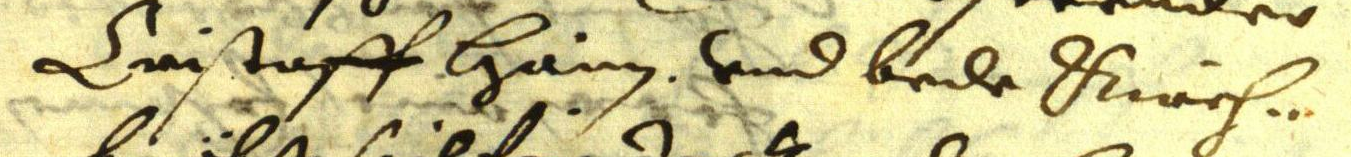Cristoff Haim. vnd bede Kirch¬
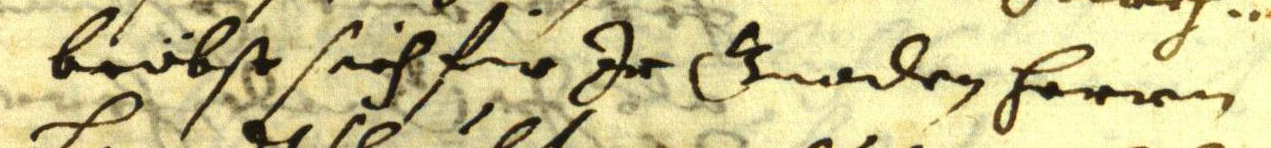bröbst sich fir Ir Gnaden herrn
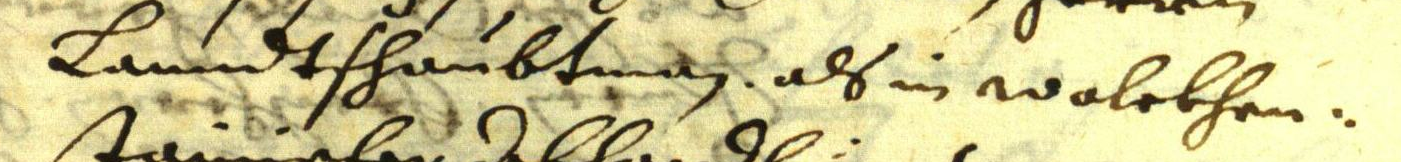Lanndtshaūbtman. als in wolckhen¬
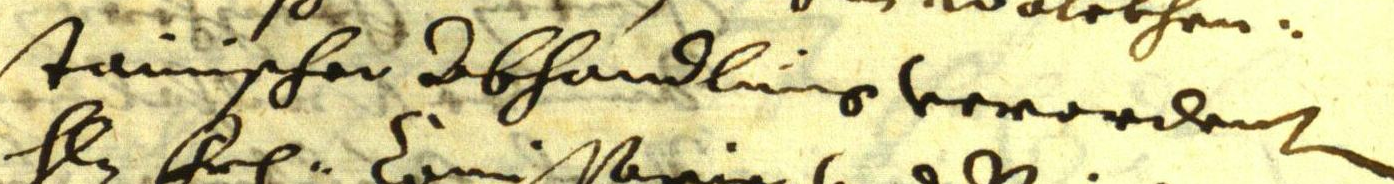stainischer Abhandlūng verordent
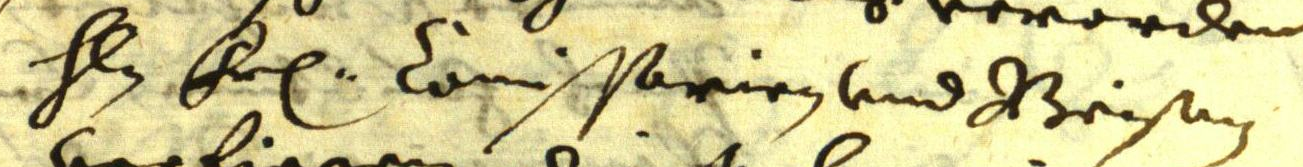hln Frl: Commissarien vnd Beistand
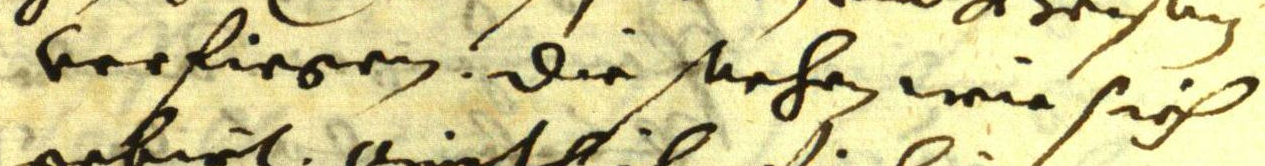verfiegen. die stehen wie sich
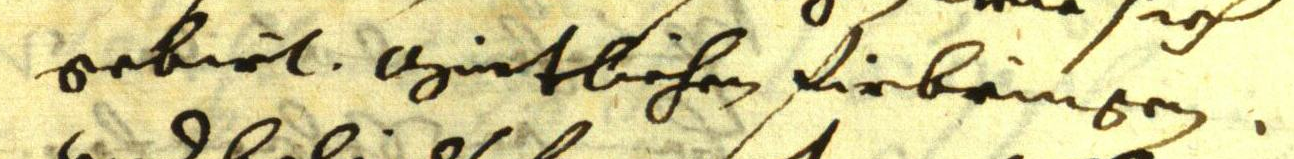gebirt. Mintlichen firbringen.
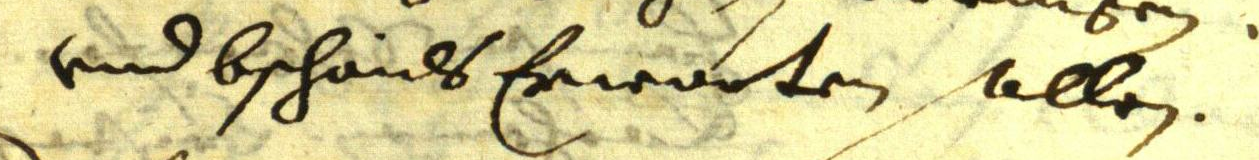vnd bschaids Erwarten sollen.
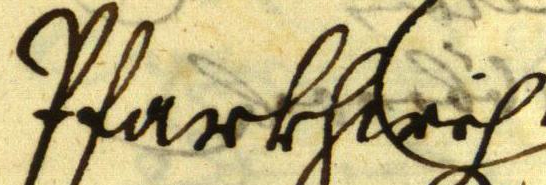Pfarrkhirch
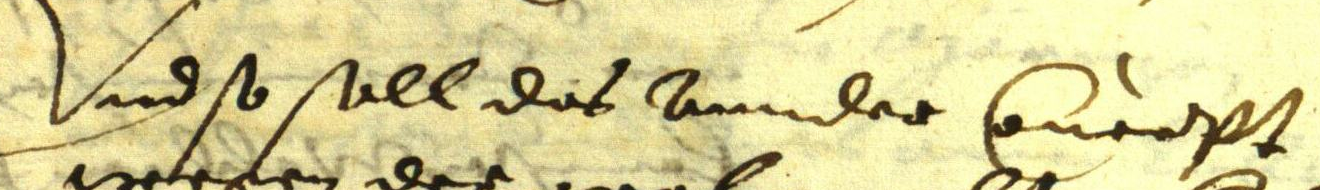Vnd so soll das Annder Concept
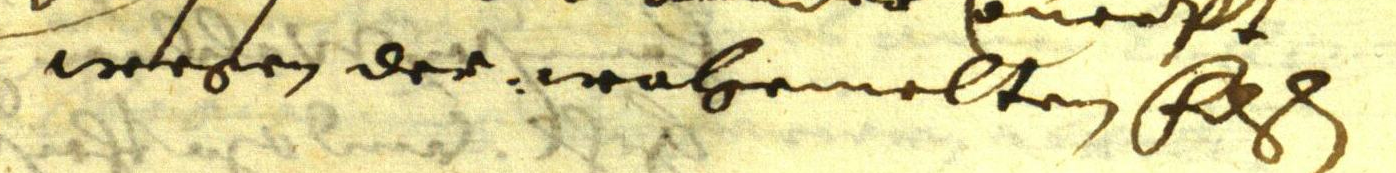wegen der: wolgemelten F
